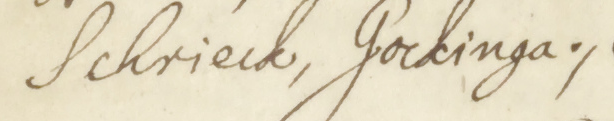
Schrieck, Gockinga.
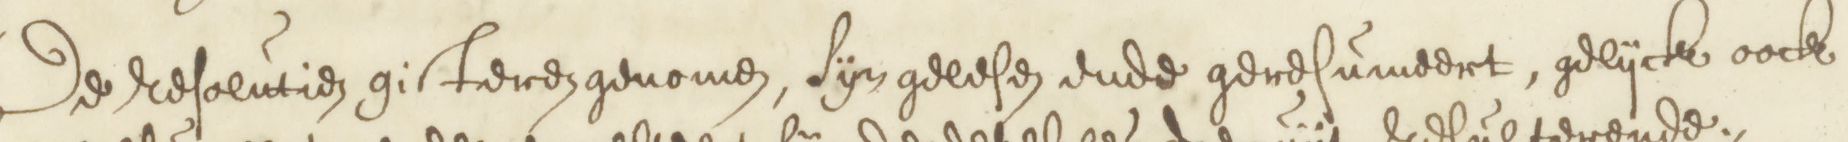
De resolutien gisteren genomen, sijn gelesen ende geresumeert, gelijck oock
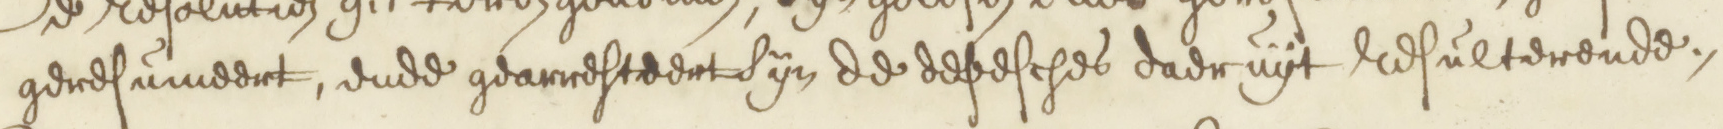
geresumeert, ende gearresteert sijn de depesches daer uijt resulterende.
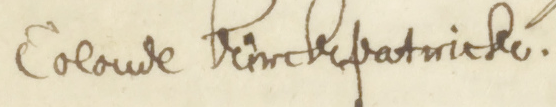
Colonel Kirckpatrick.
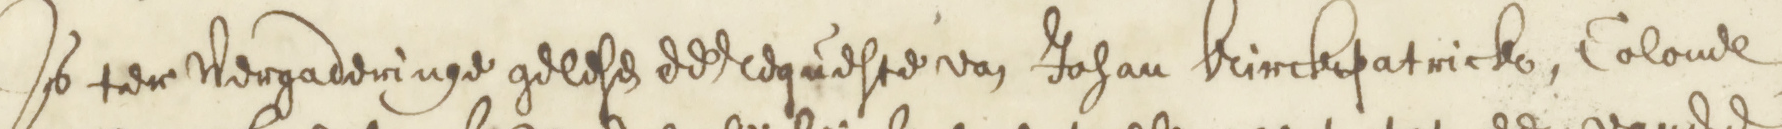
Is ter Vergaderinge gelesen de Requeste van Johan Kirckpatrick, Colonel
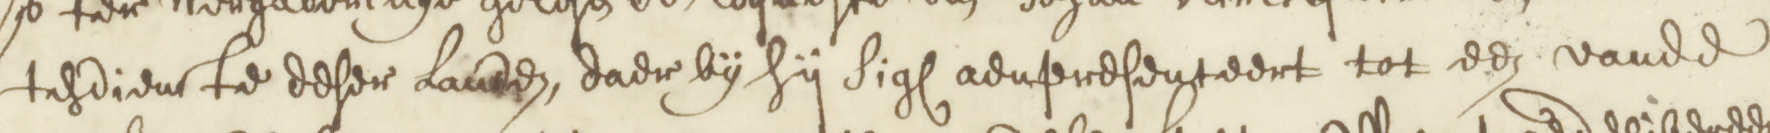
ten dienste deser Landen, daer bij hij sigh aenpresenteert tot een vande
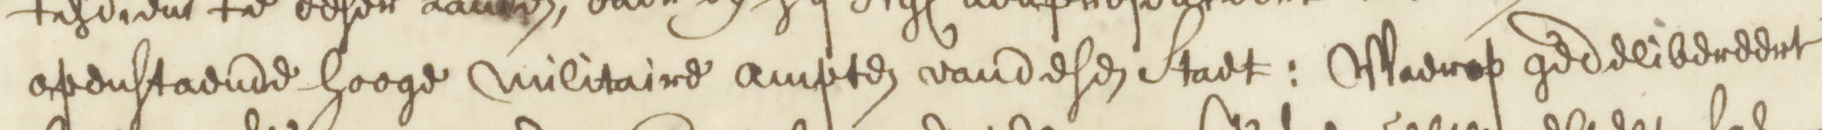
openstaende hooge militaire ampten van desen staet: Waerop gedelibereert
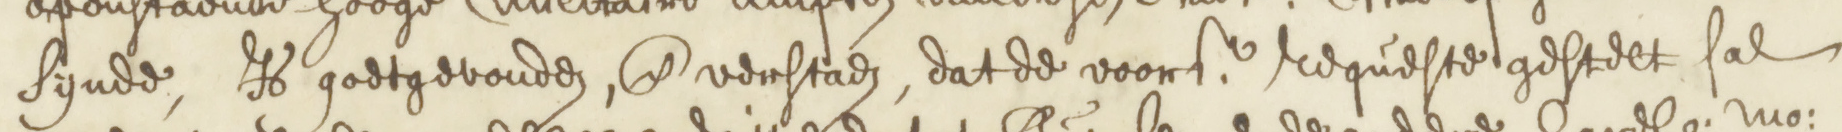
sijnde, Is goetgevonden, & verstaen, dat de voors. Requeste gestelt sal
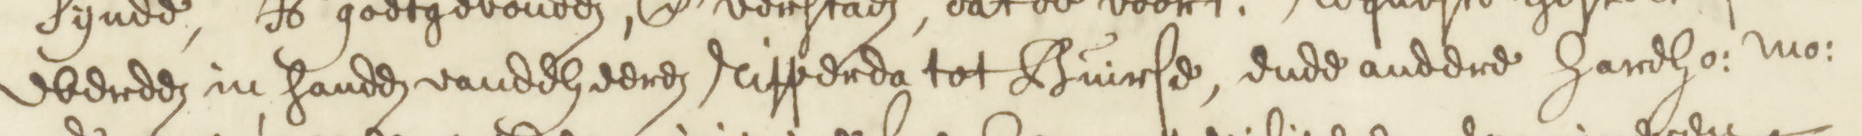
werden in handen vande heeren Ripperda tot Buirse, ende andere hare ho:mo:
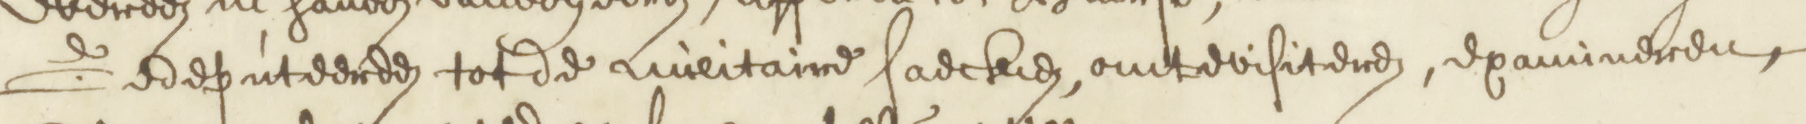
Gedeputeerden tot de militaire saecken, om te visiteren, examineren,
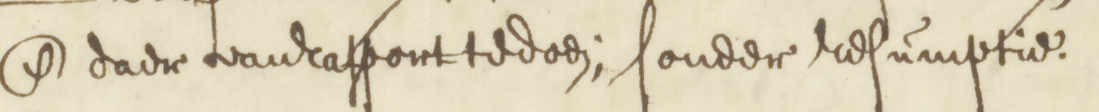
& daer van rapport te doen; sonder resumptie.
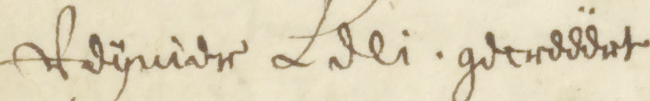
Reijnier Leli, gecreeërt
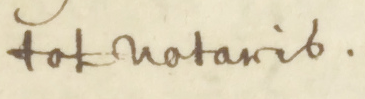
tot notaris.
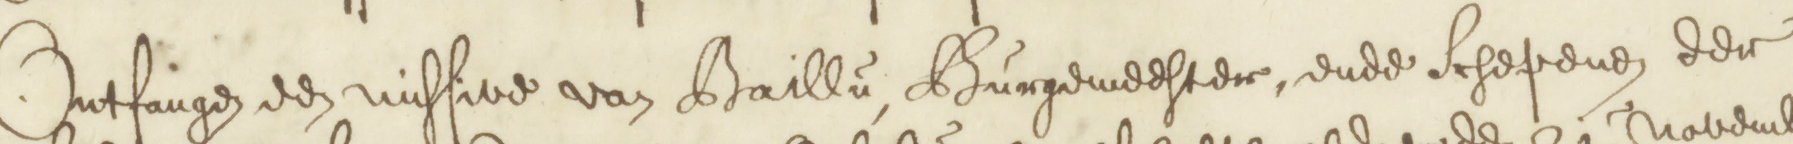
Ontfangen een missive van Baillu, Burgemeester, ende schepenen der
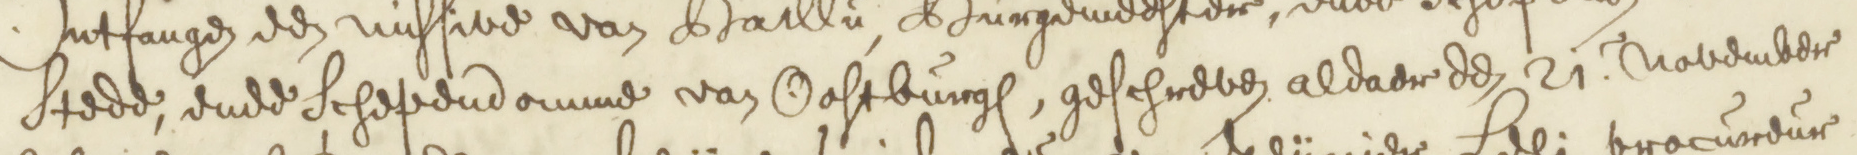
stede, ende schependomme van Oostburgh, geschreven aldaer den 21e. november
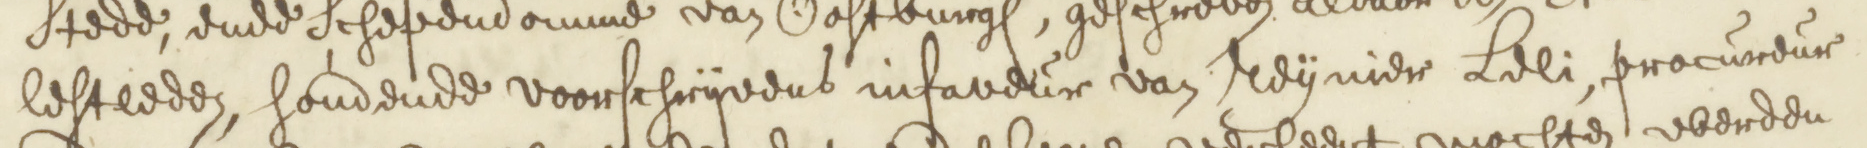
lestleden, houdende voorschrijvens infaveur van Reijnier Leli, procureur
